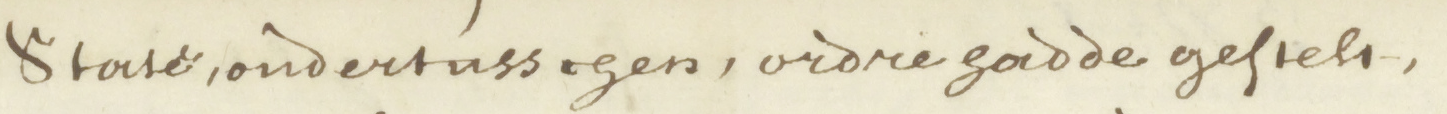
State, ondertusschen, ordre hadde gestelt,
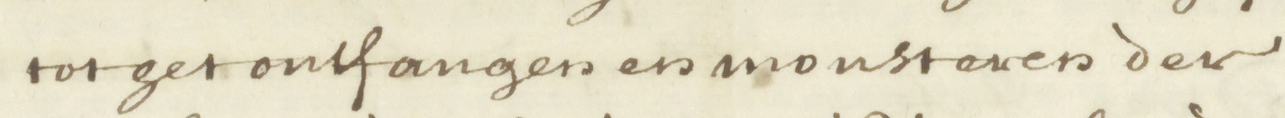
tot het ontfangen en monsteren der
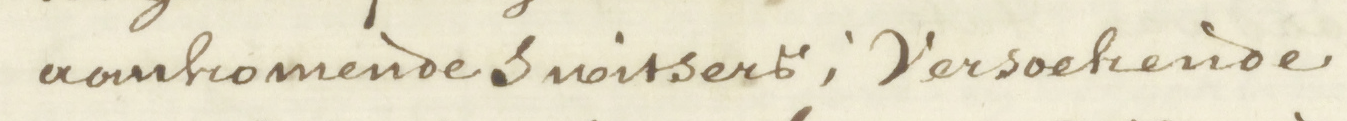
aankomende Switsers; Versoekende
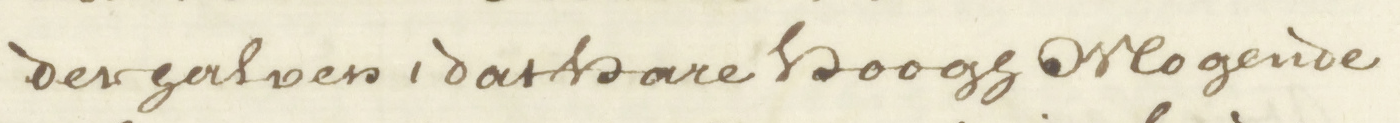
derhalven, dat hare Hoogh Mogende
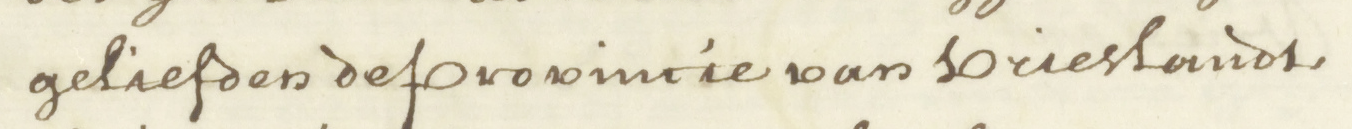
geliefden de Provincie van Vrieslandt
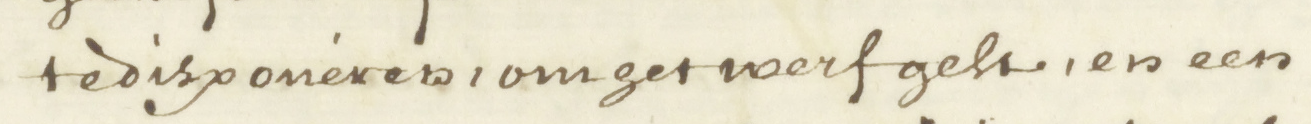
te disponeren, om het werfgelt, en een
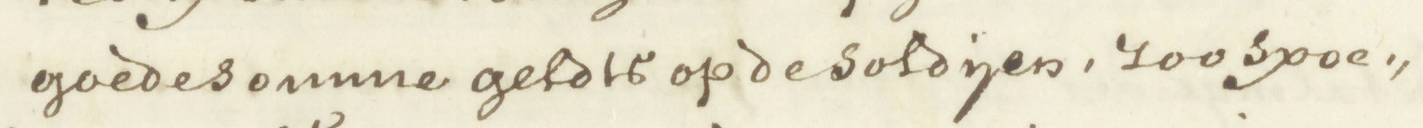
goede somme geldts op de soldijen, zoo spoe„
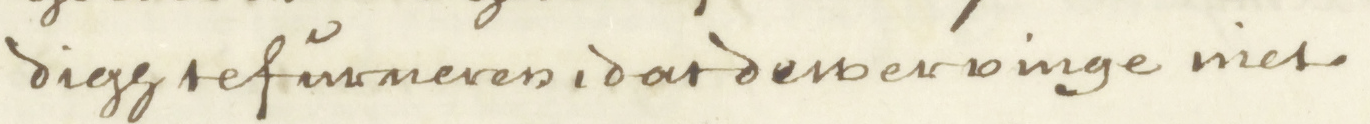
digh te furneren, dat de wervinge niet
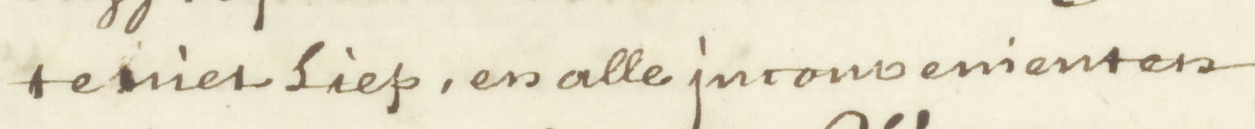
te niet liep, en alle inconvenienten
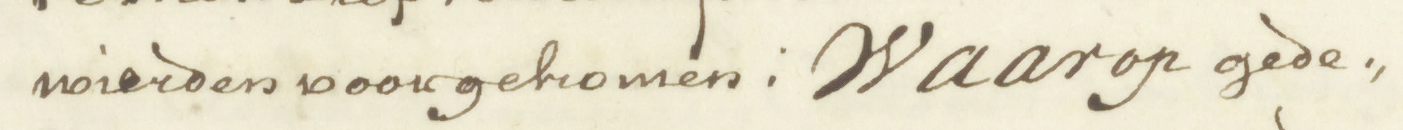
wierden voorgekomen: Waarop gede„
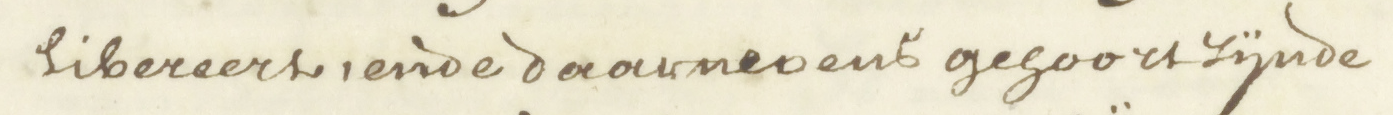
libereert, ende daarnevens gehoort zijnde
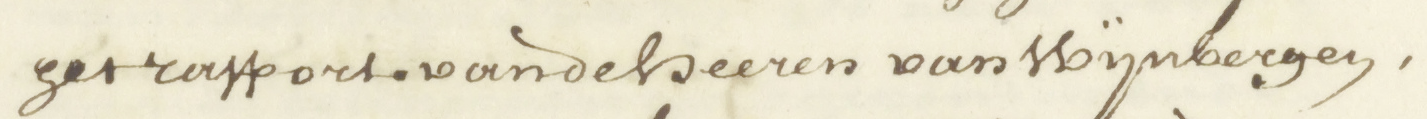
het rapport van de heeren van Wijnbergen,
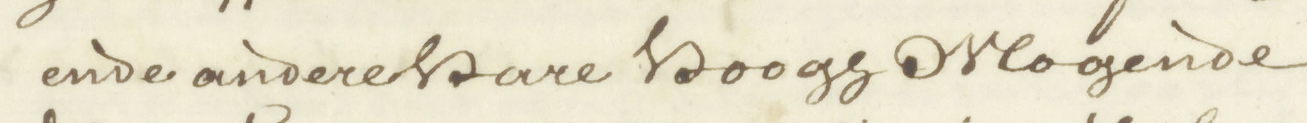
ende andere hare Hoogh Mogende
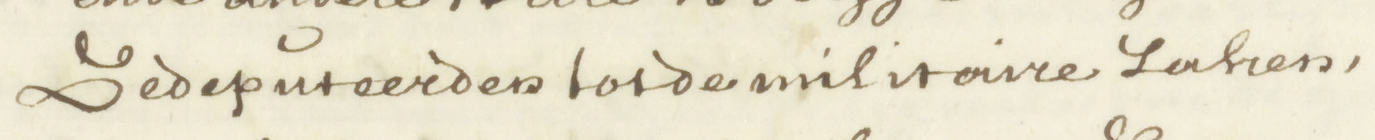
Gedeputeerden tot de militaire zaken,
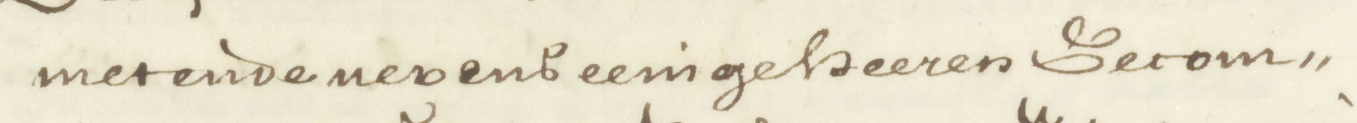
met ende nevens eenige heeren Gecom„
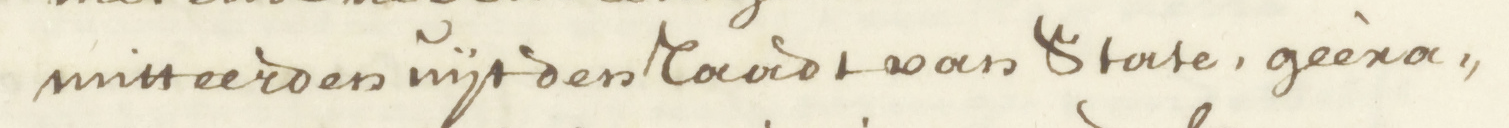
mitteerden uijt den Raadt van State, geexa„
